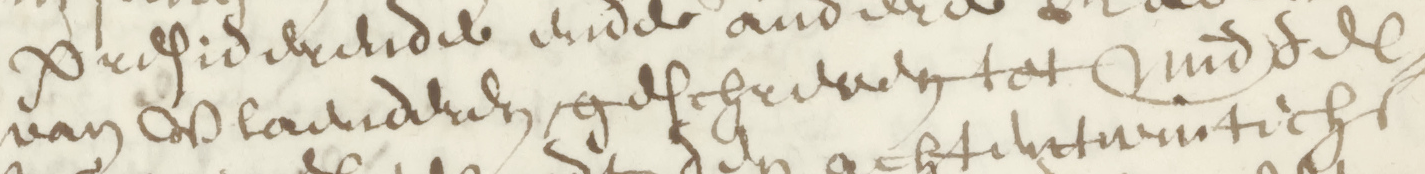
van Vlaenderen, geschreven tot Middel„
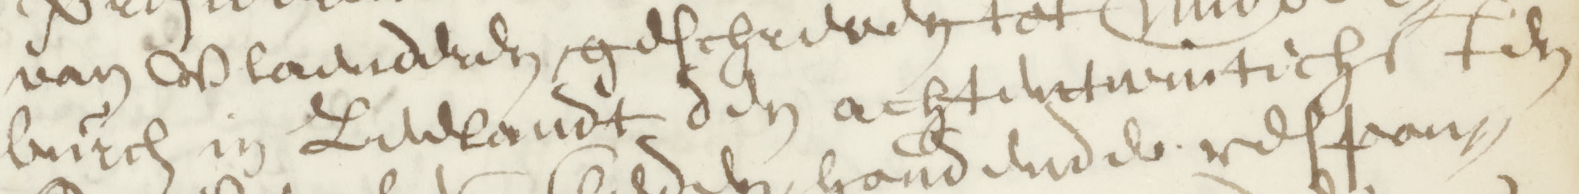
burch in Zeelandt den achtentwintichsten
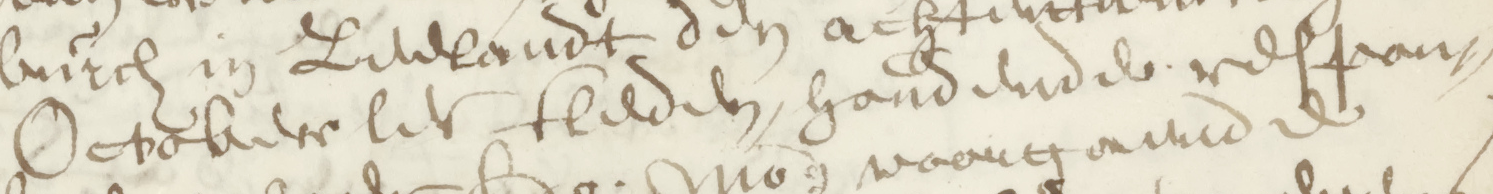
October lestleden, houdende respon„
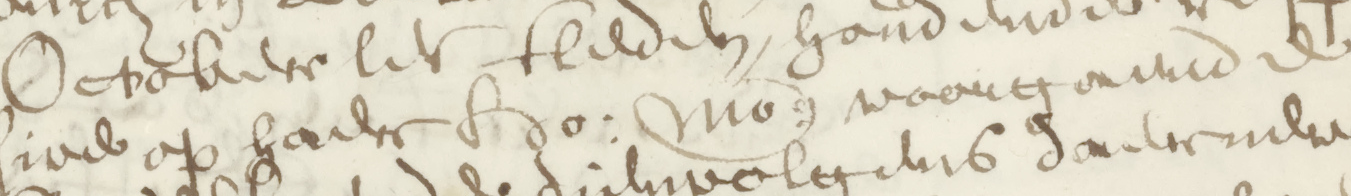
sive op haer Ho:Mo: voorgaende
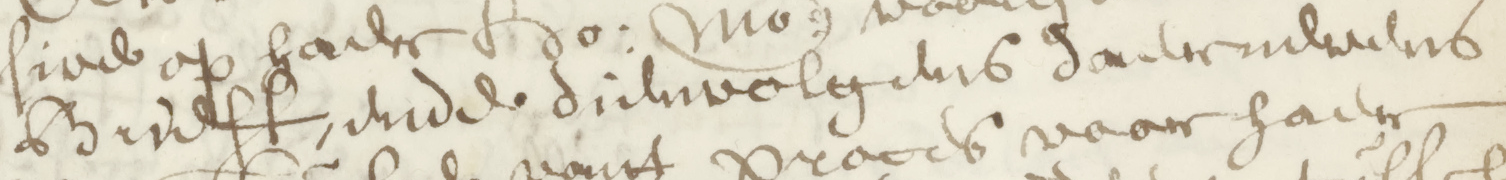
Brieff, ende dienvolgens daernevens
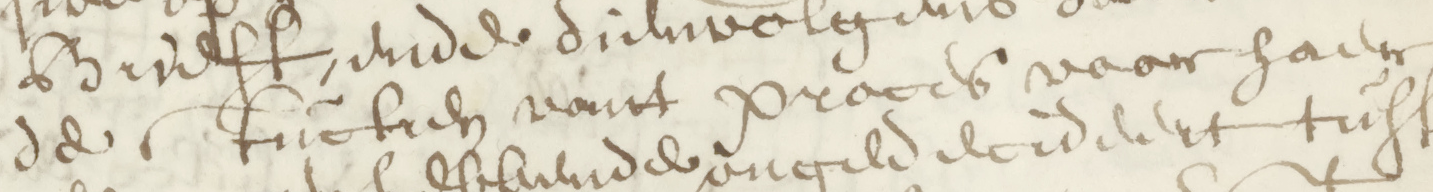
de stucken vant proces voor haer
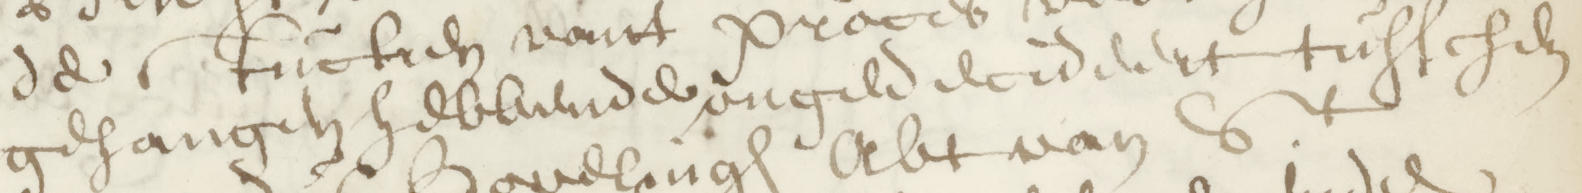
gehangen hebbende ongedecideert tusschen
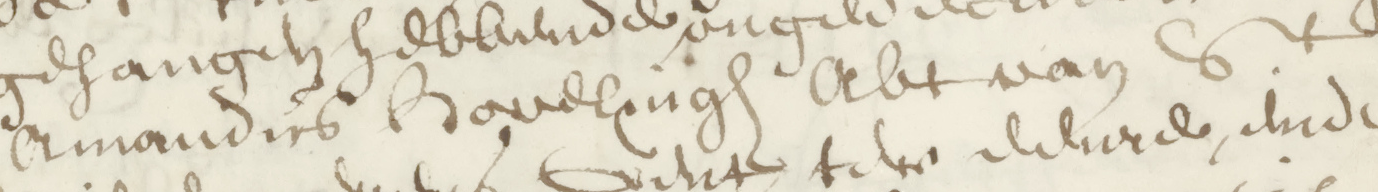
Amandus Hovelingh Abt van St.
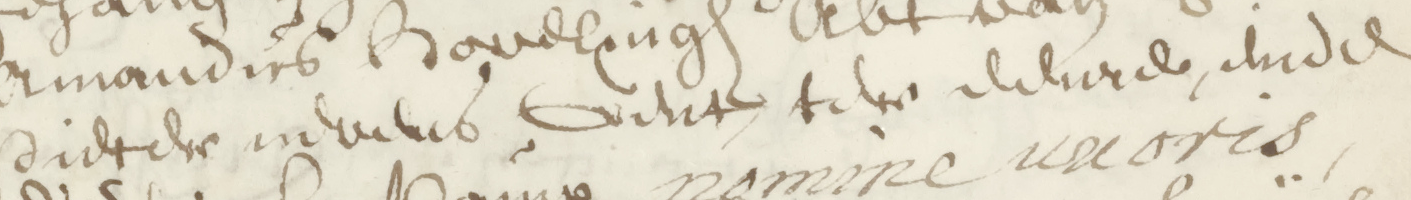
Pieter nevens Gent, ter eenre, ende
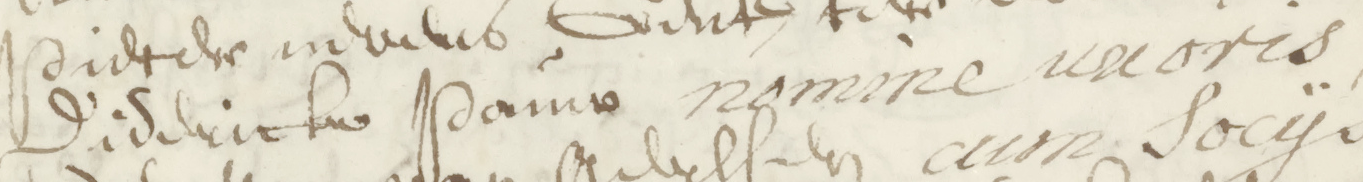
Diderick Pauw nomine uxoris,
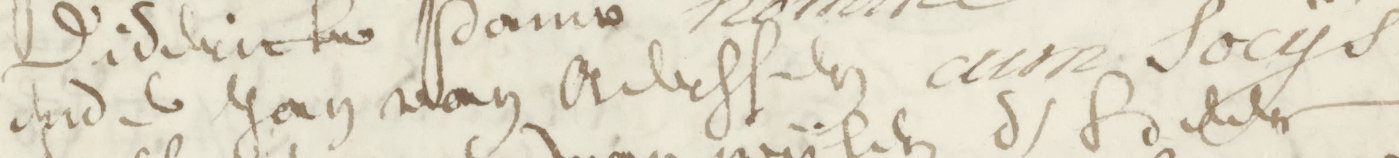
ende Jan van Aerssen cum socijs
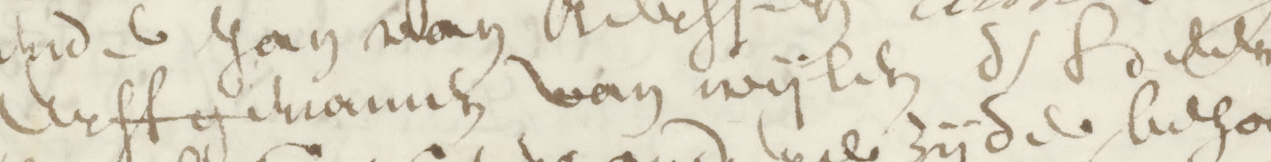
Erffgenamen van wijlen d'Heer
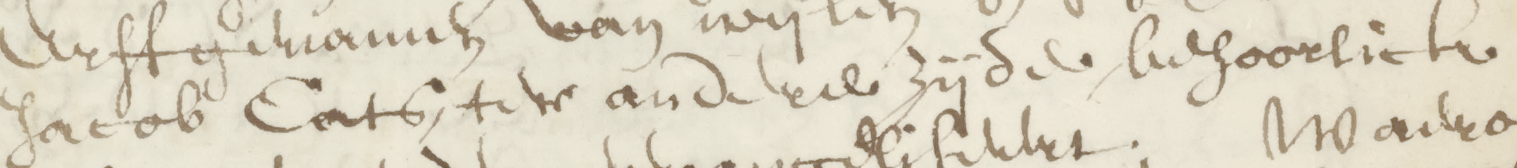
Jacob Cats, ter andere zijde, behoorlick
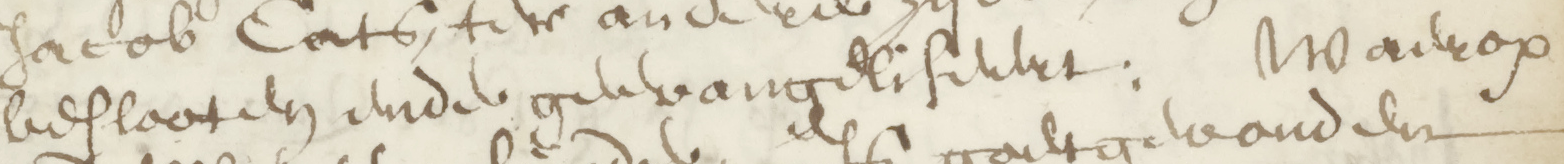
beslooten ende geevangeliseert: Waerop
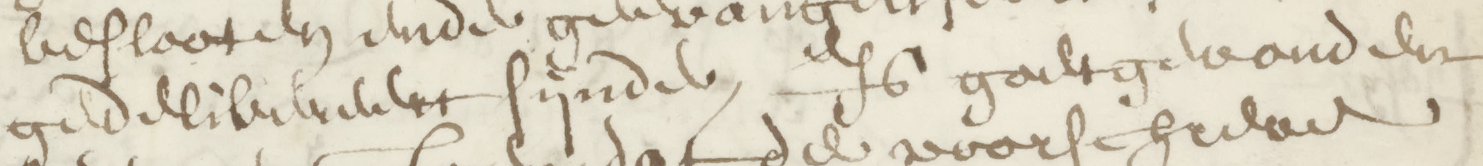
gedelibereert sijnde, Is goetgevonden
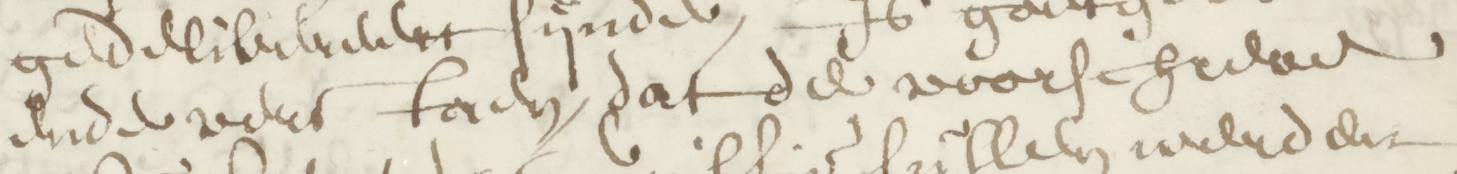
ende verstaen, dat de voorschreve
